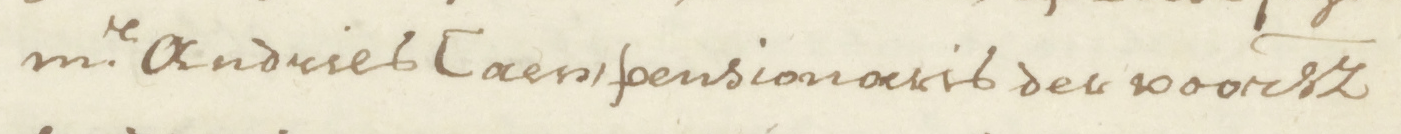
mr. Andries Caen, pensionaris der voorsz
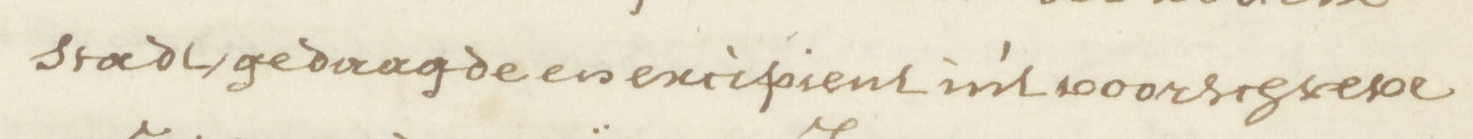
stadt, gedaagde en excipient in't voorschreve
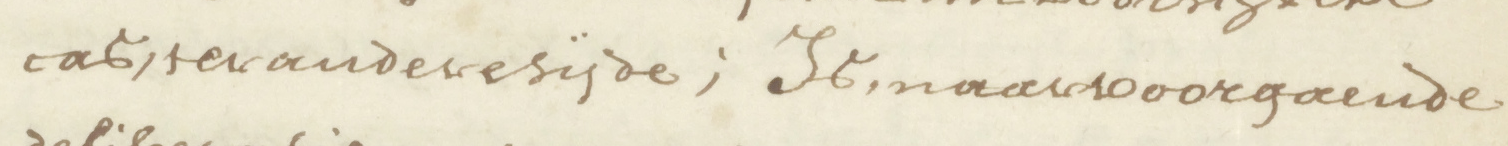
cas, ter andere sijde; Is naar voorgaende
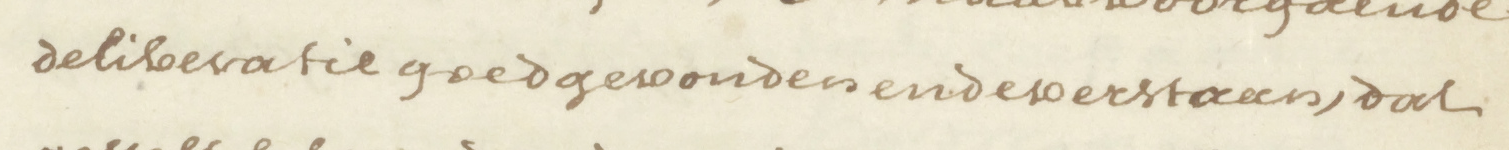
deliberatie goedgevonden ende verstaan, dat
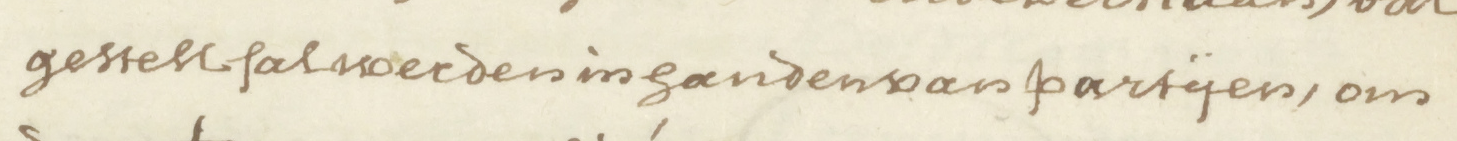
gestelt sal werden in handen van partijen, om
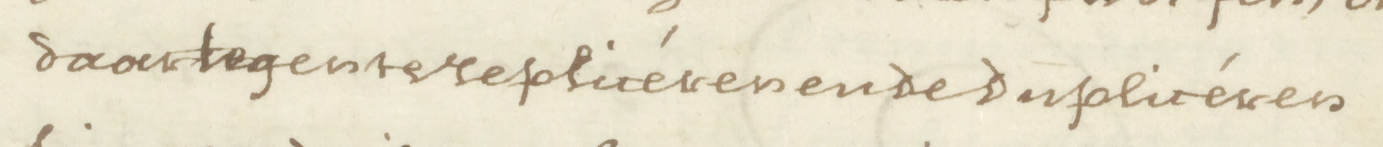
daartegen te repliceren ende dupliceren
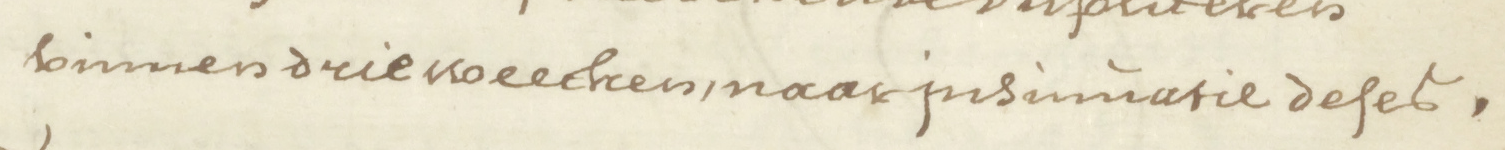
binnen drie weecken, naar insinuatie deses,
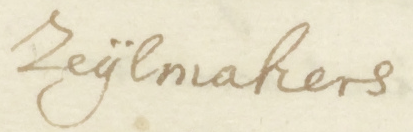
Zeijlmakers
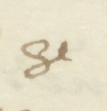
ca
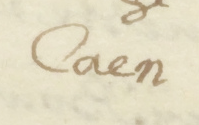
Caen
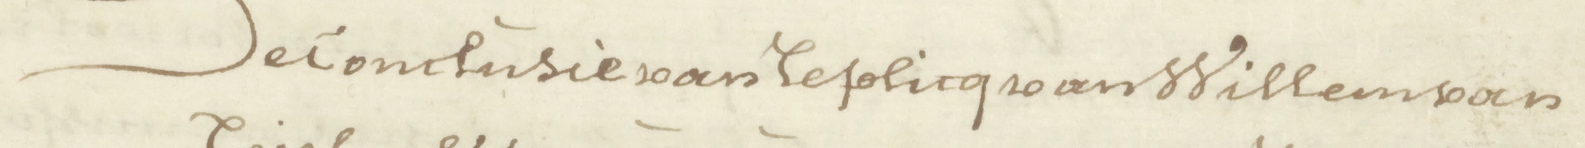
De conclusie van replicq van Willem van
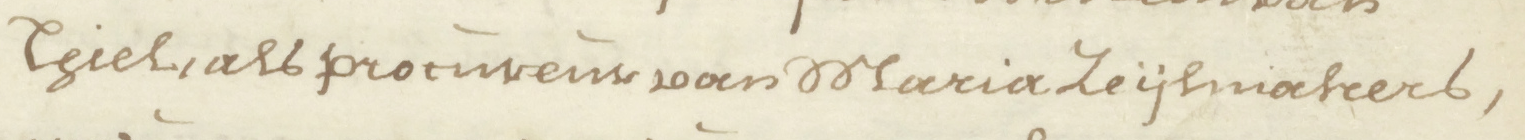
Thiel, als procureur van Maria Zeijlmakers,
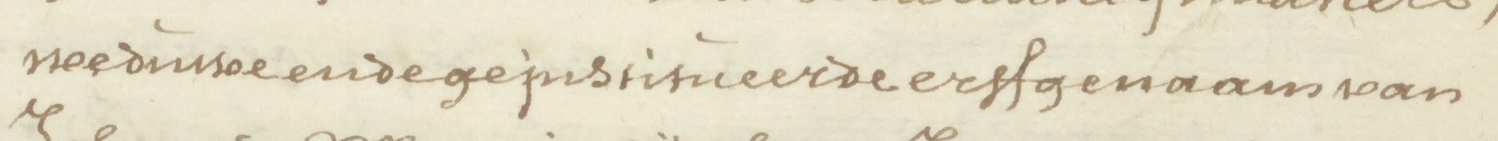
weduwe ende geinstitueerde erffgenaam van
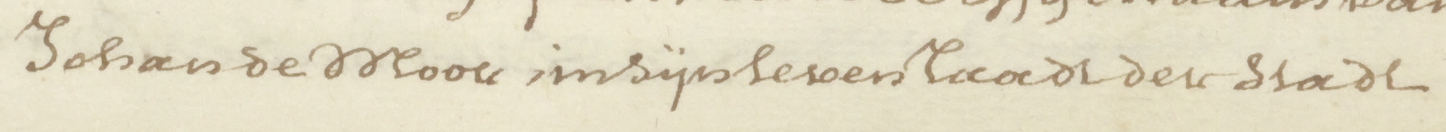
Johan de Moor, in sijn leven raadt der stadt
